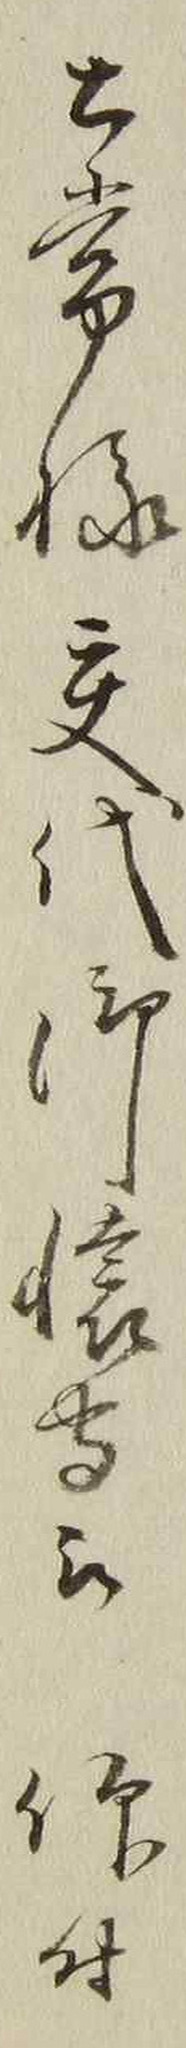土常様交代御懐守被仰付
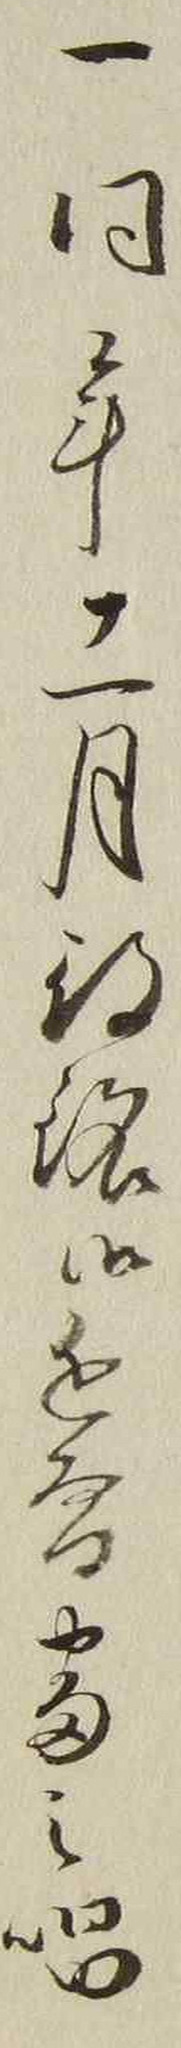一同年十一月役銘御近習番之唱
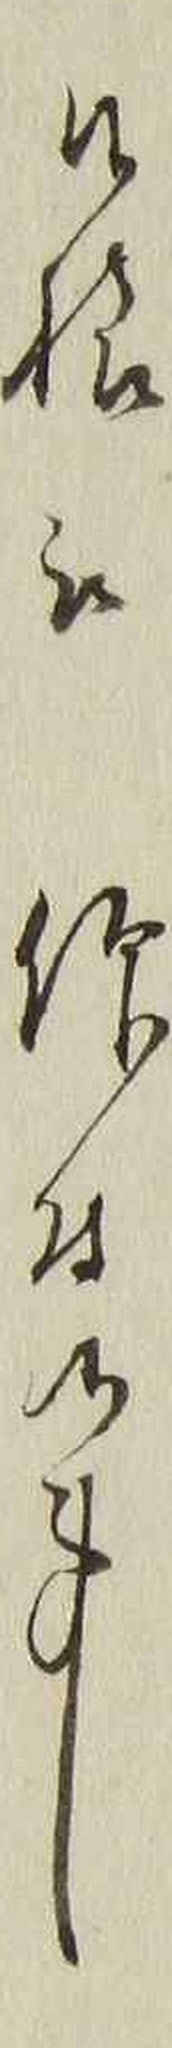候様被仰付候事
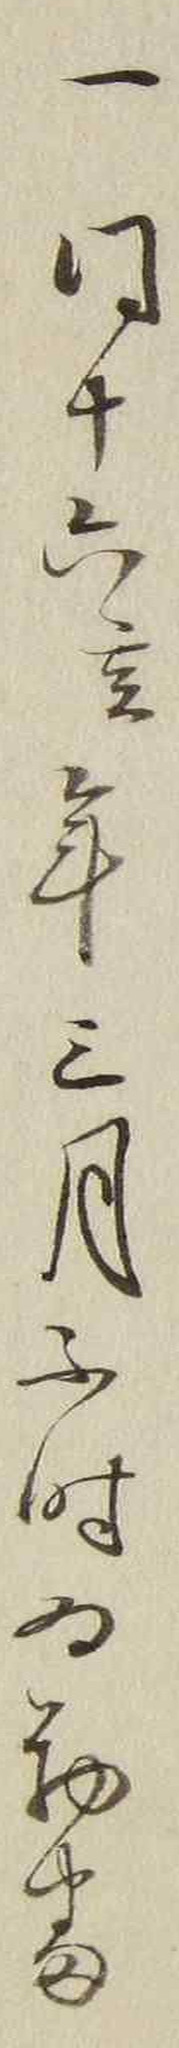一同十六亥年三月不時為勤番

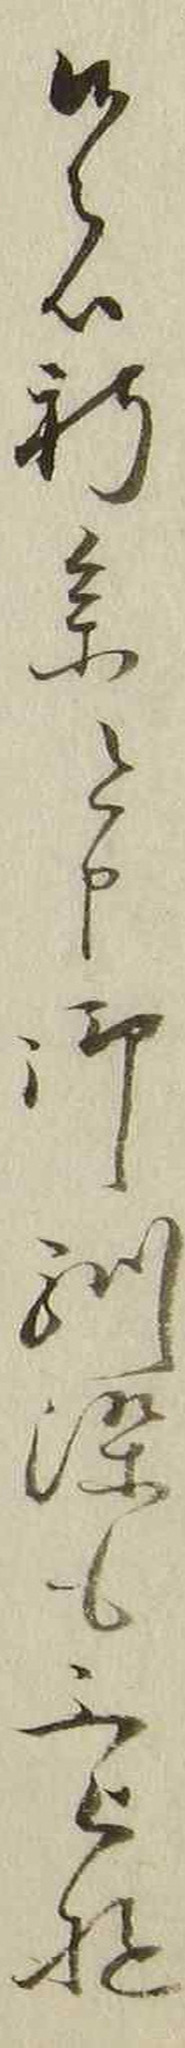候者新参と申御馴染も不被遊
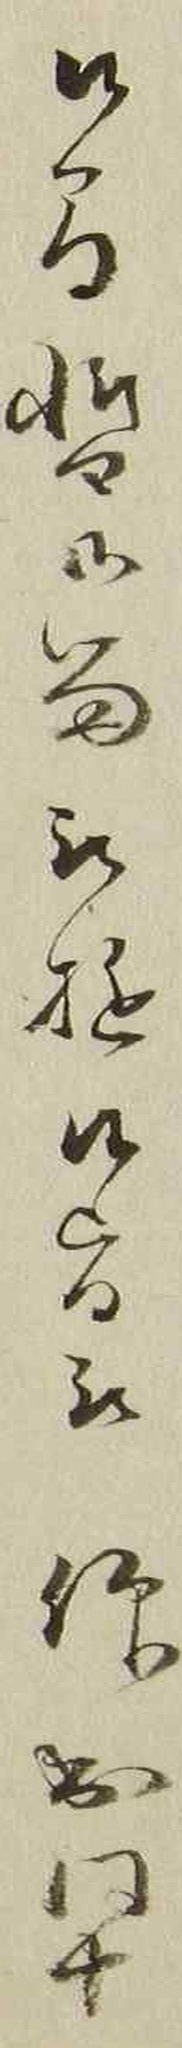候間暫御留被遊候旨被仰出同十
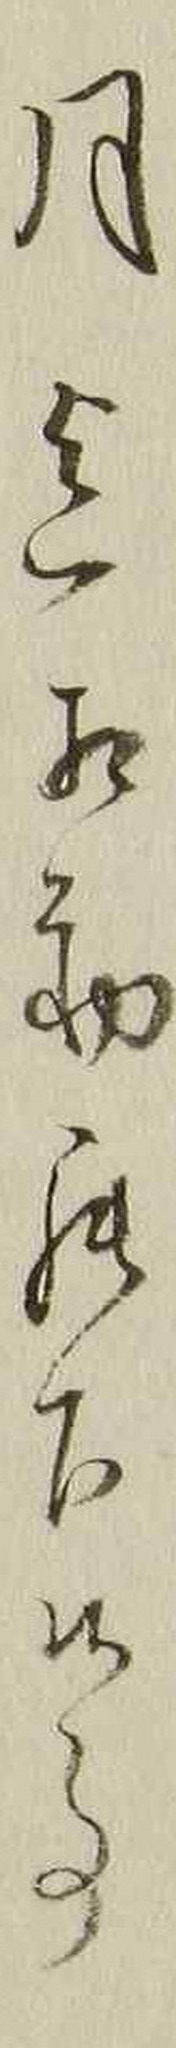月迄相勤罷下候事
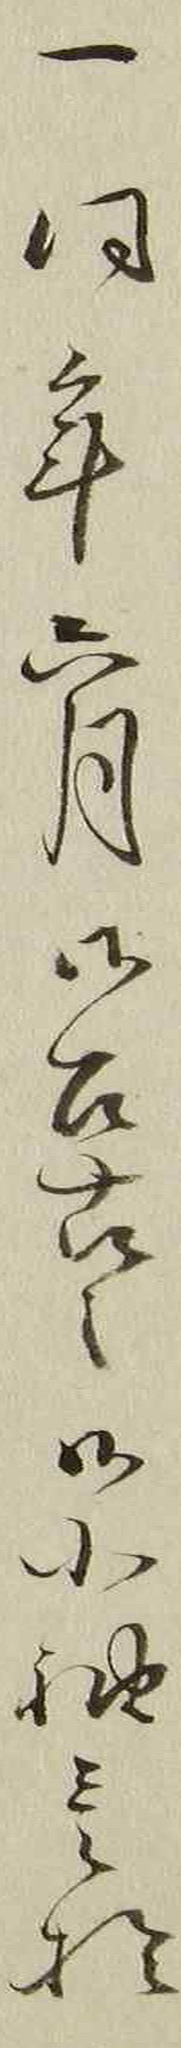一同年六月御召古之御小袖壱於
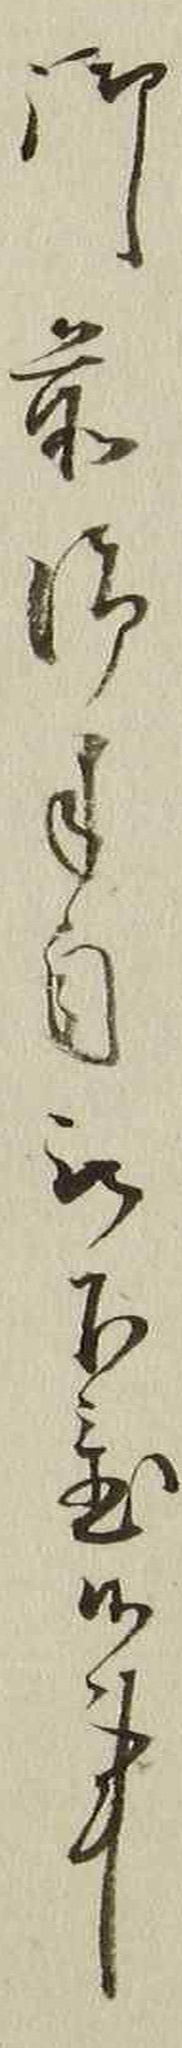御前御手自被下置候事
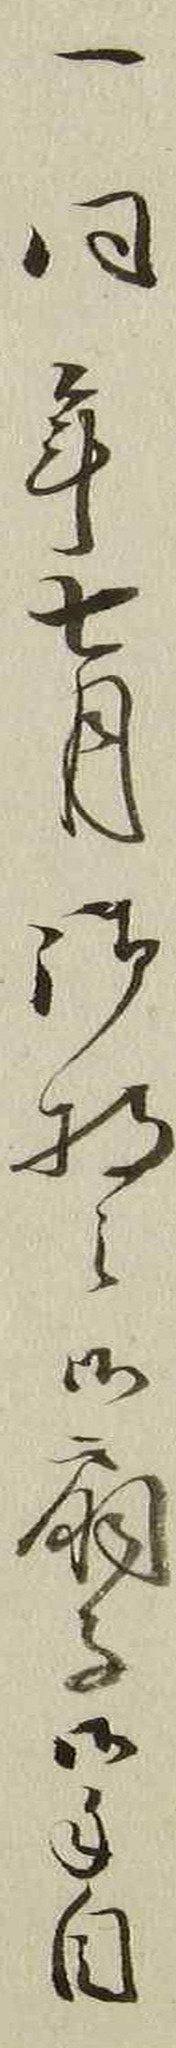一同年七月御持之御扇子御手自
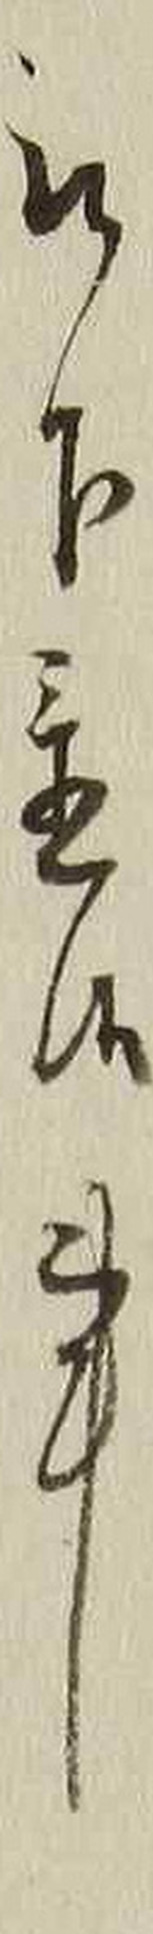被下置候事
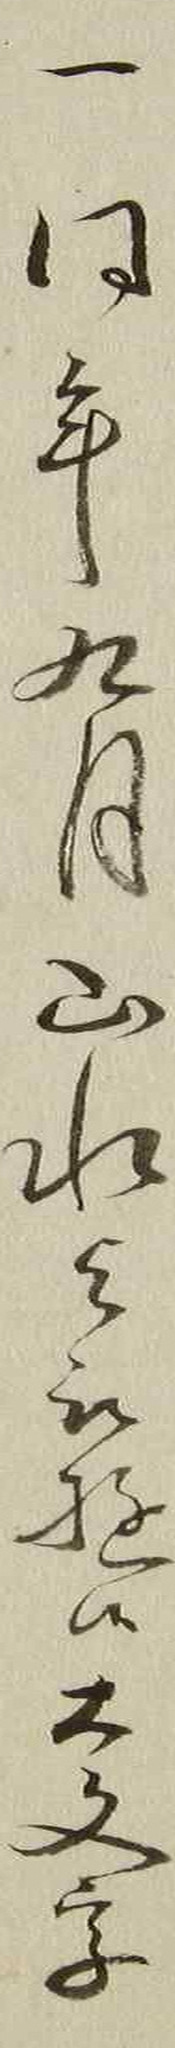一同年九月山水迄被遊候大文字
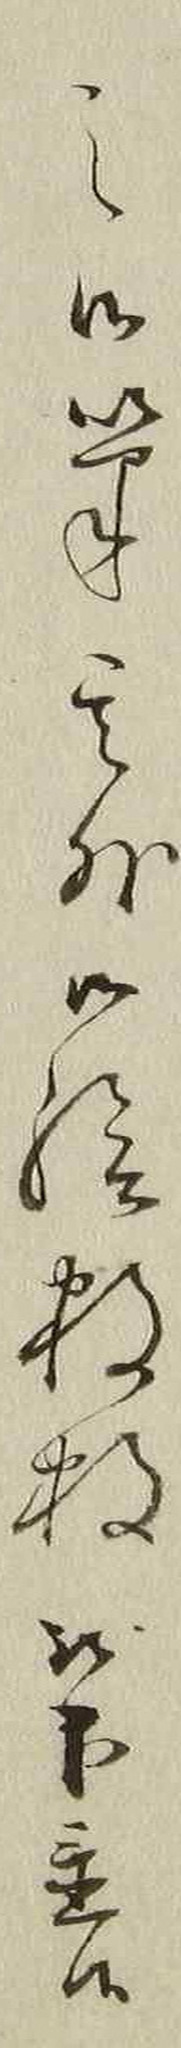之御筆其外御絵数枚被下置候
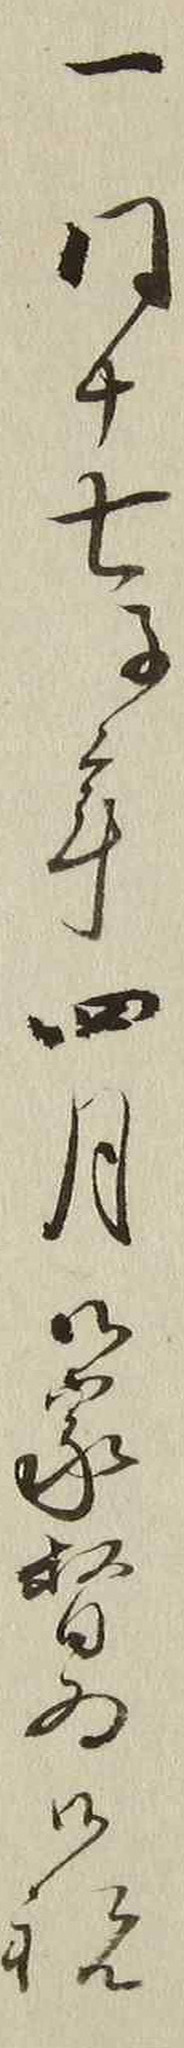一同十七子年四月御家督為御祝
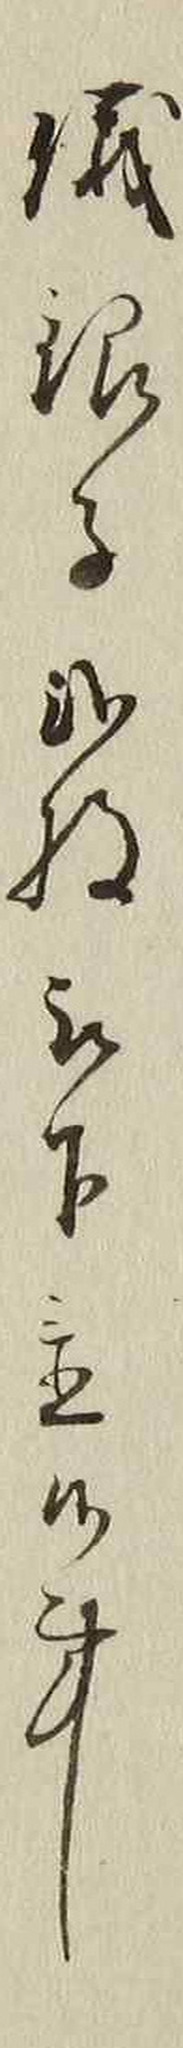儀銀子弐枚被下置候事
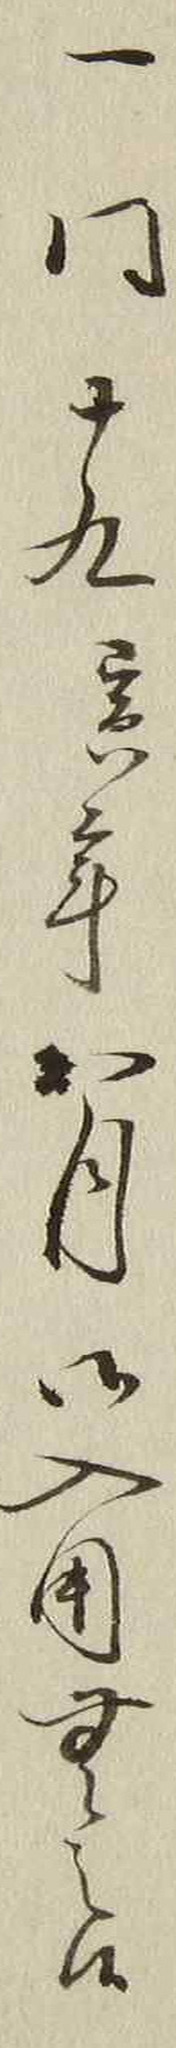一同十九寅年八月御入用無之候
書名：諸士系譜　巻之129　た之部5
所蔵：会津若松市立会津図書館
